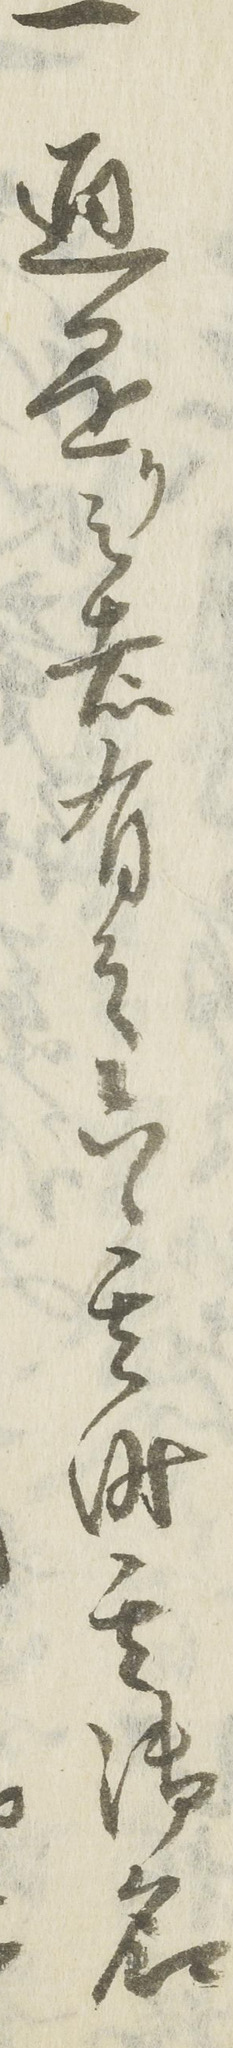一通懸リ之者有之候はゝ其時其御名
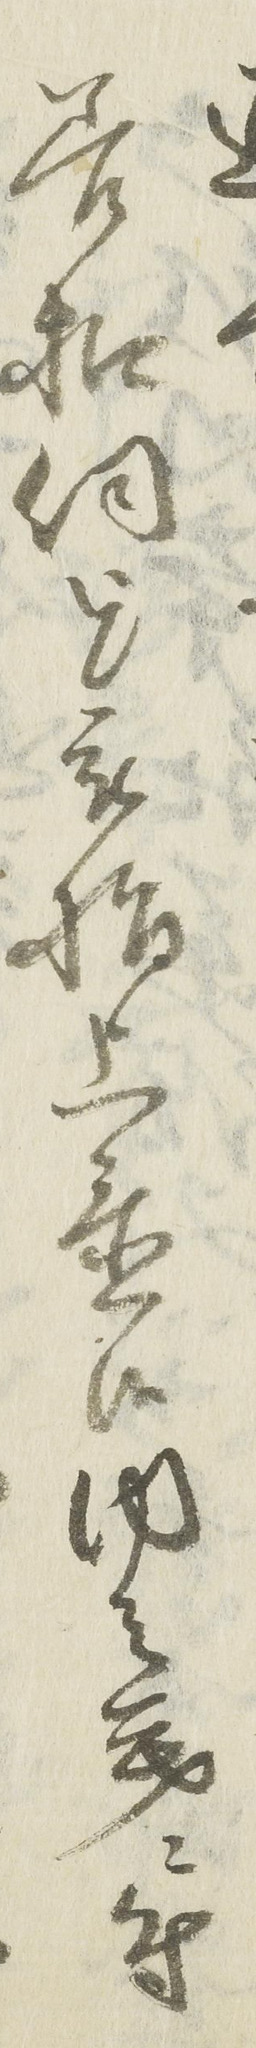差扣伺を被指上置候内之義ニ付
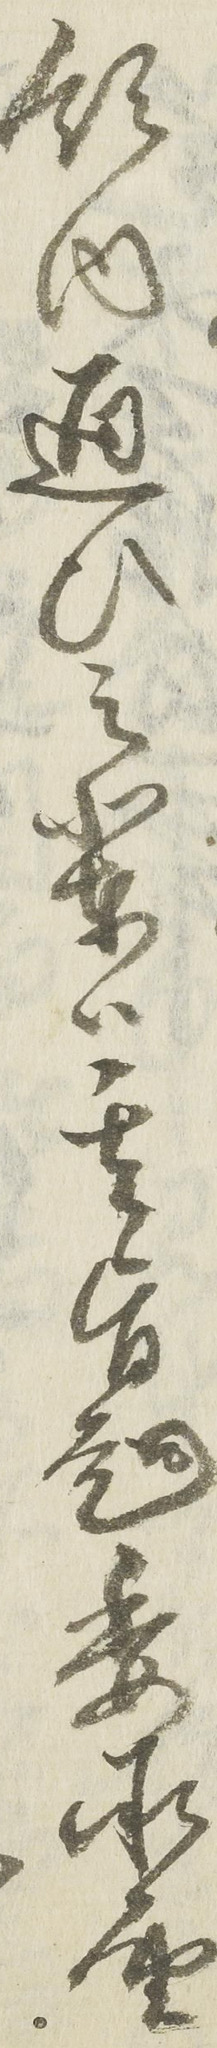領内通ひ之輩は其旨趣委承届
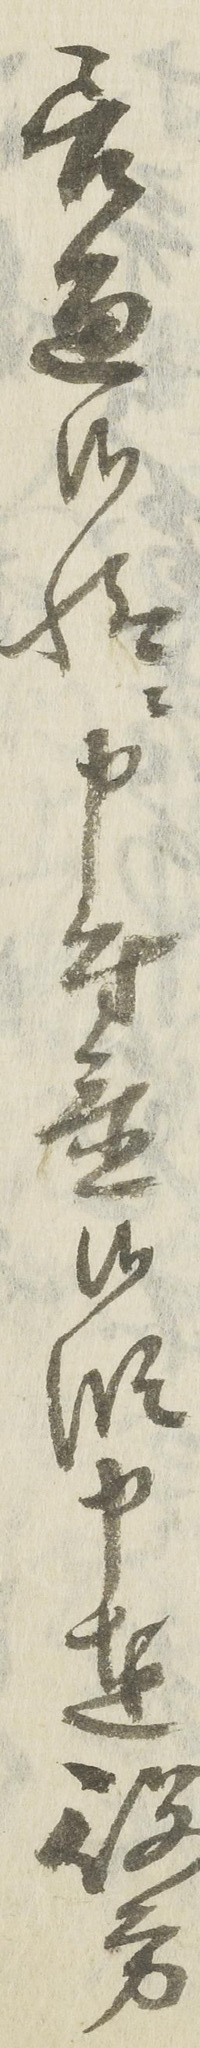差通候様ニ申付置候段申達役方
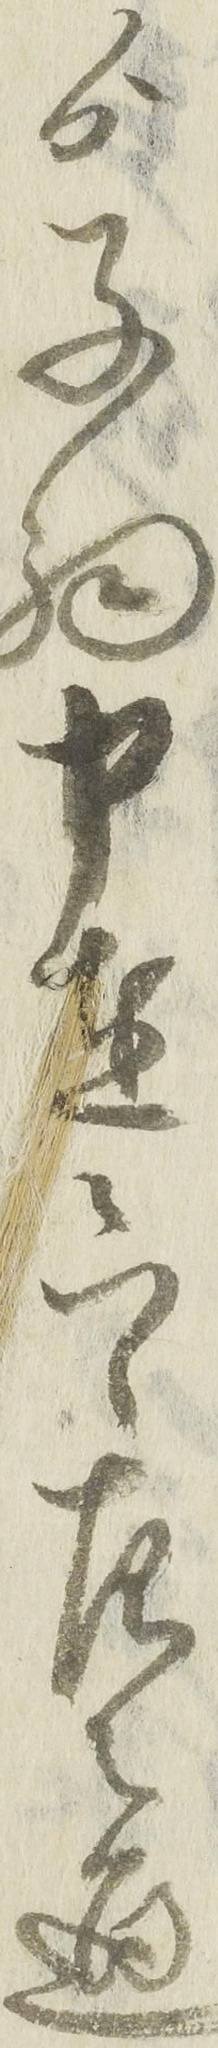ゟ子細申達候はゝ左之通
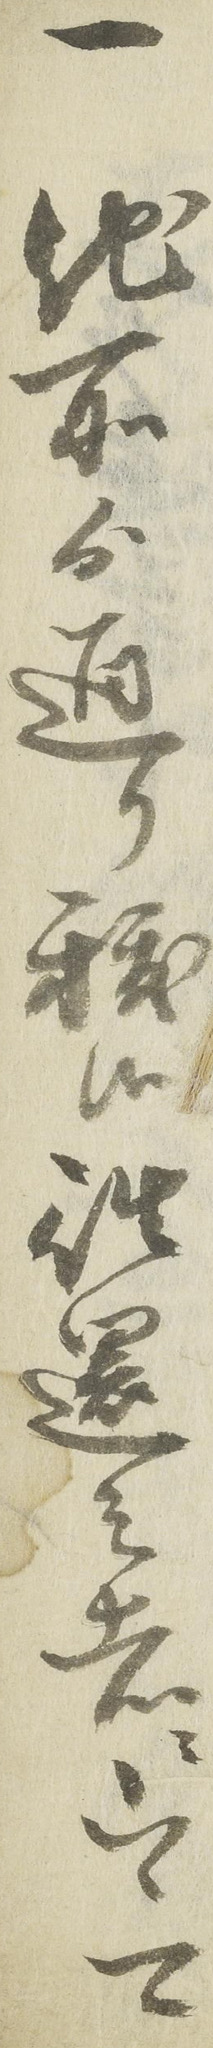一他所ゟ通り抜候往還之者ニ候はゝ可

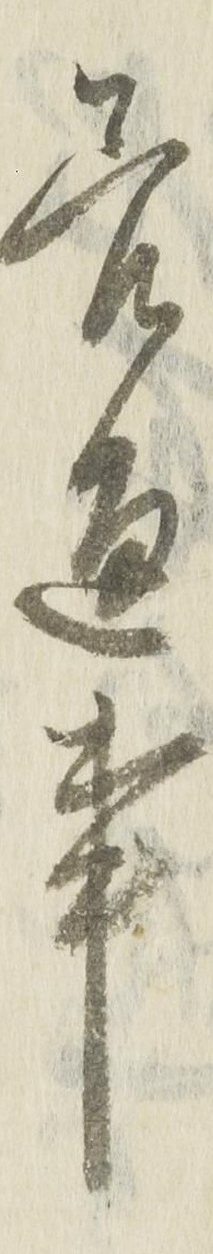差通事
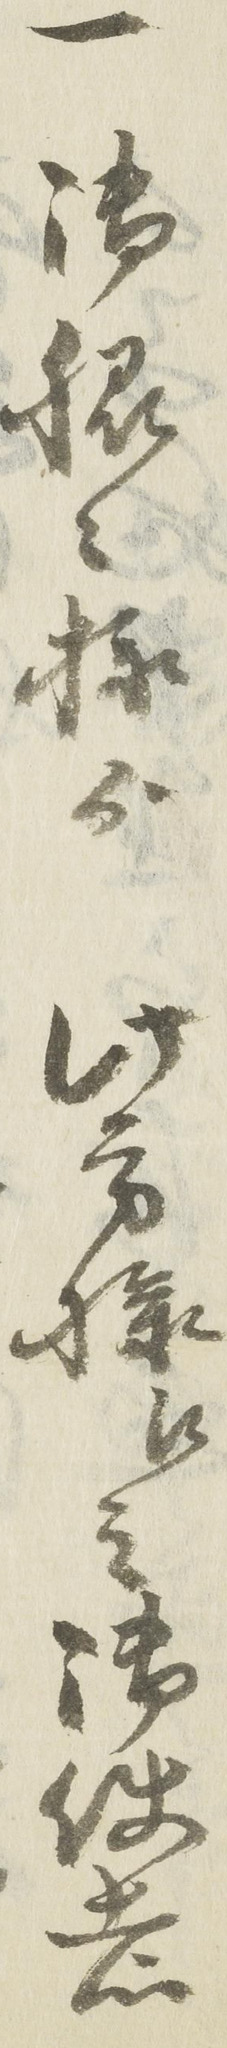一御脇々様ゟ此方様江之御使者
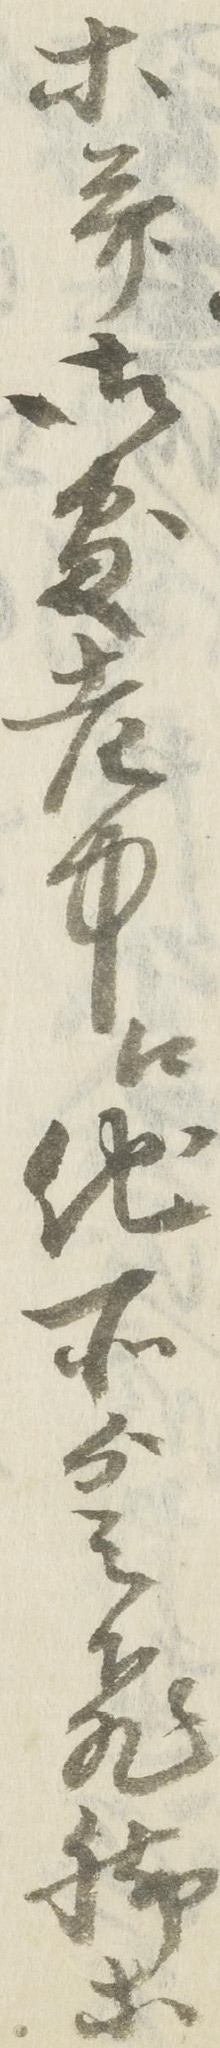等并御家老中江他所ゟ之飛脚等
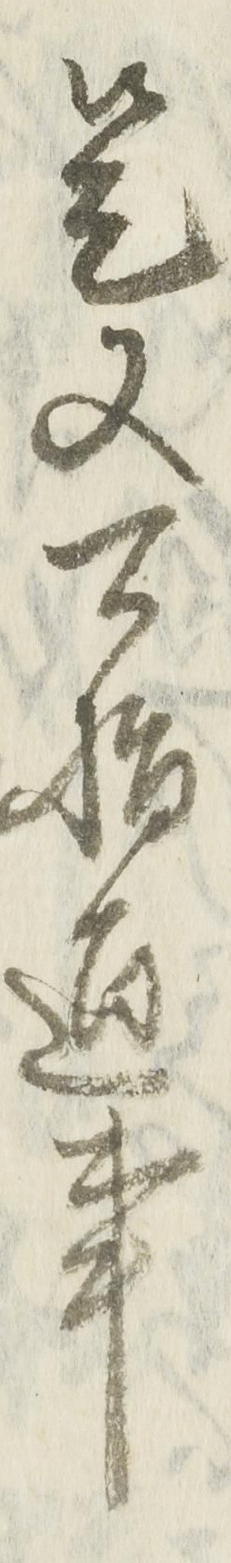是又可指通事
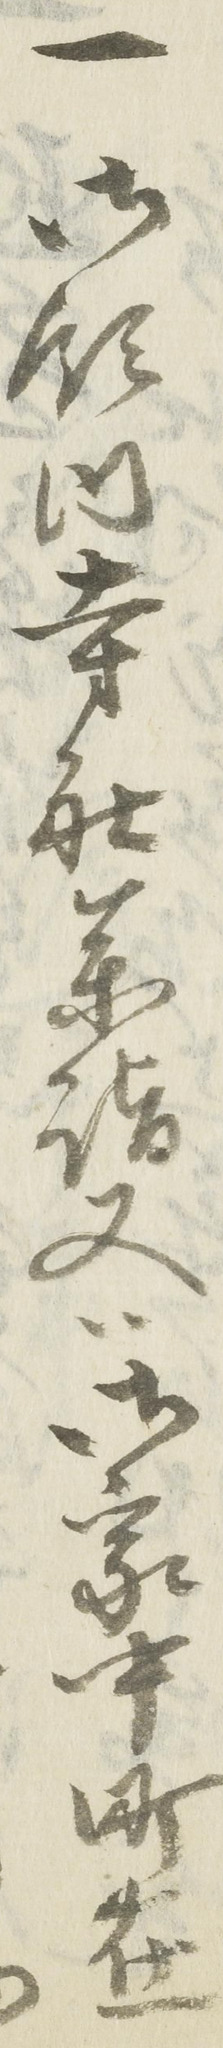一御領内寺社参詣又は御家中町在
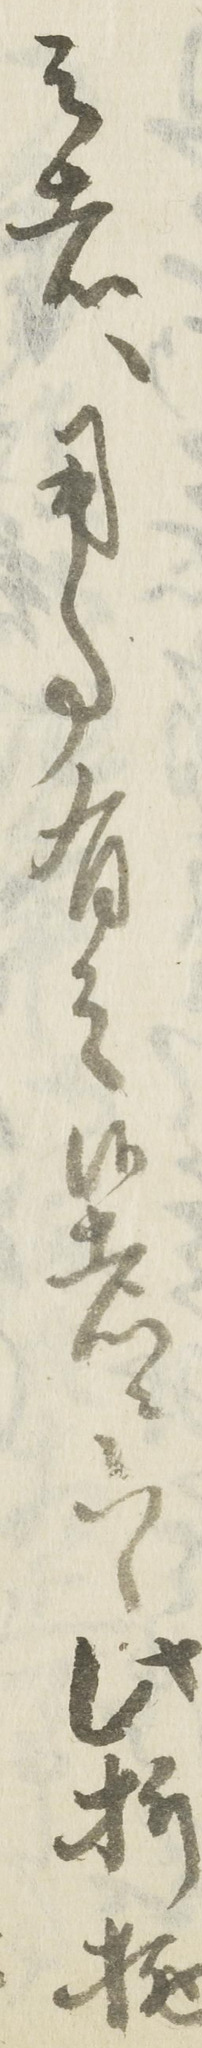の者へ用事有之候者ニ候はゝ此折柄
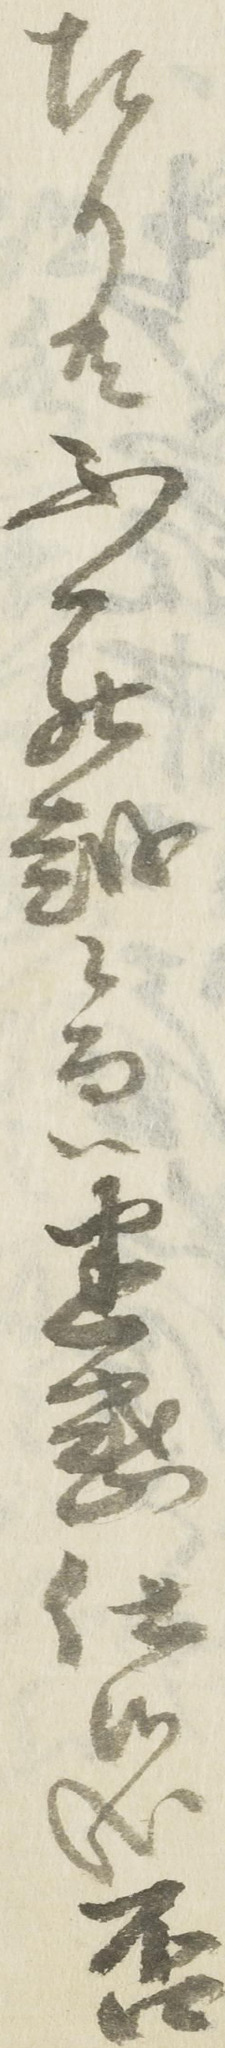たり共不罷越候而は迷惑仕候哉否
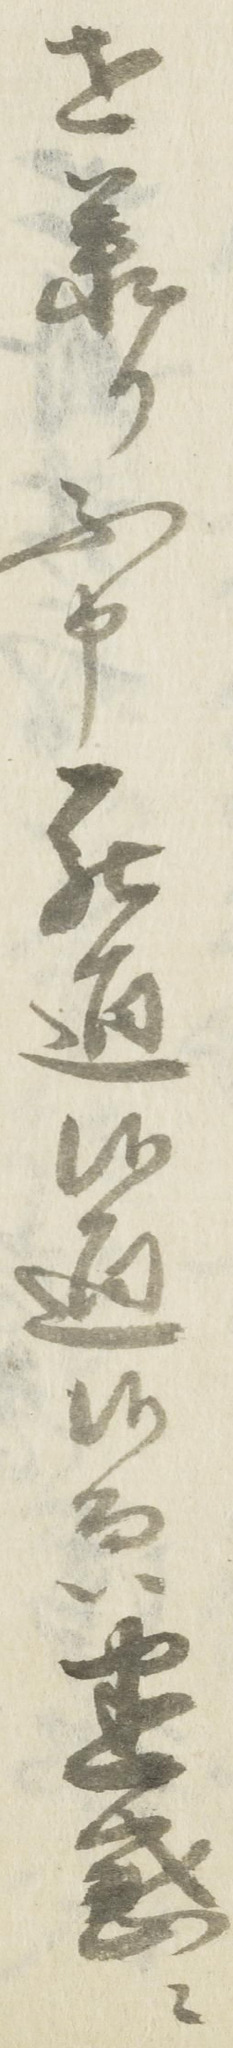を承り不申罷通候通候而は迷惑ニ
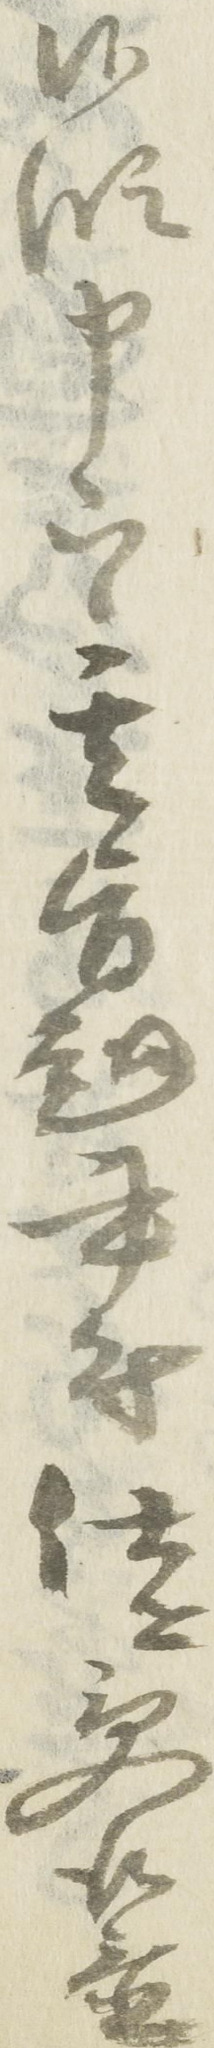候段申候はゝ其旨趣書付仕を受取置
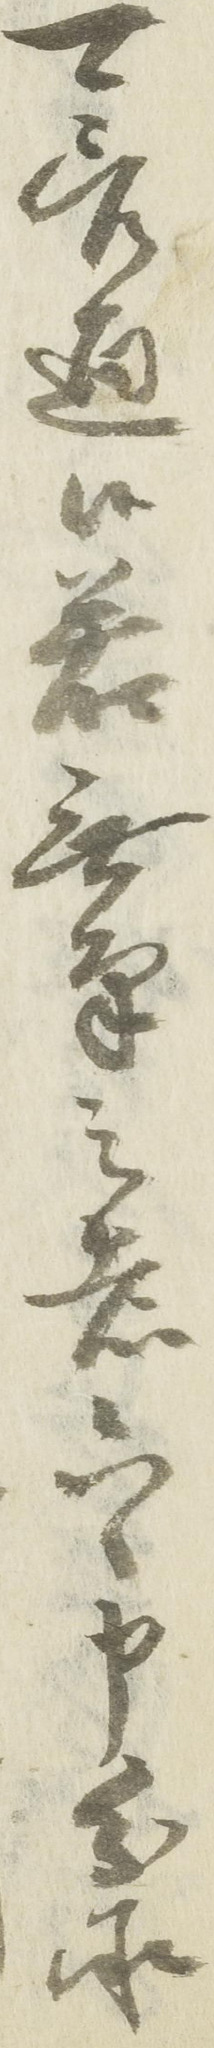可差通候若無筆の者候はゝ申分承
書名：後見笑
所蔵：東京大学地震研究所図書室 Earthquake Research Institute Library, The University of Tokyo, JAPAN
